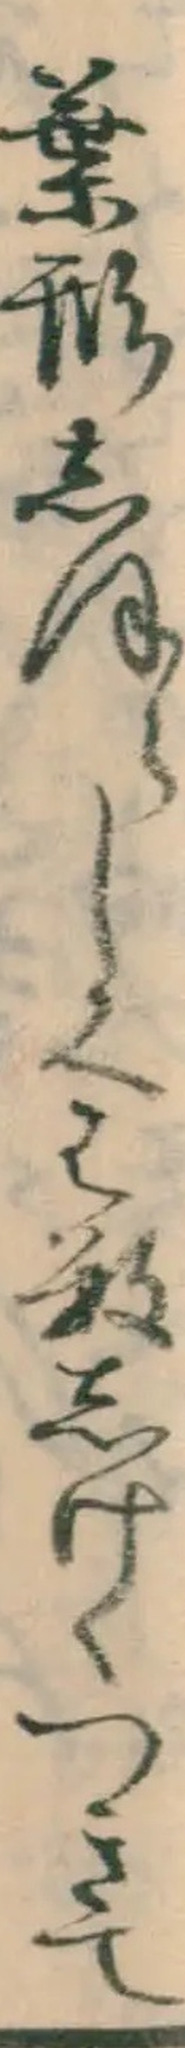千染葉形しほらしく葉数しけくつきて
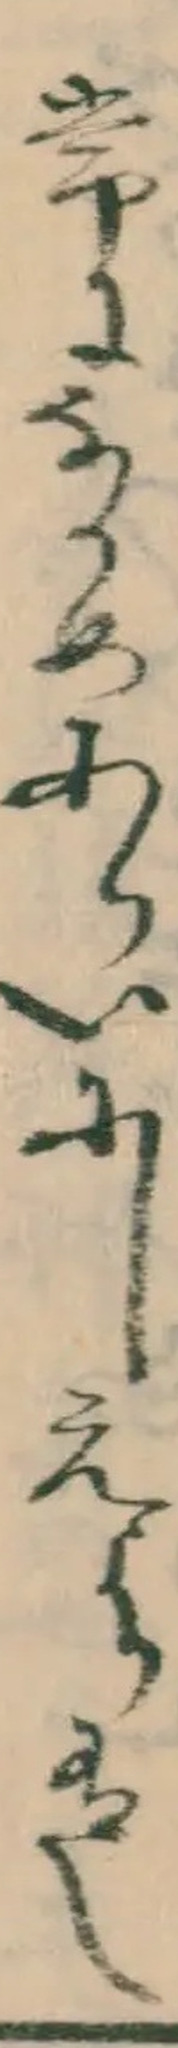常になかめありいにしえより有し
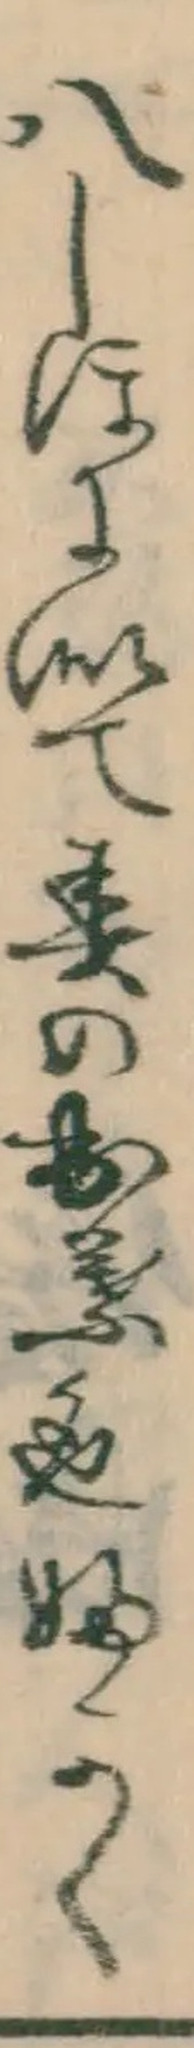八しほに似て春の出葉色ふかく
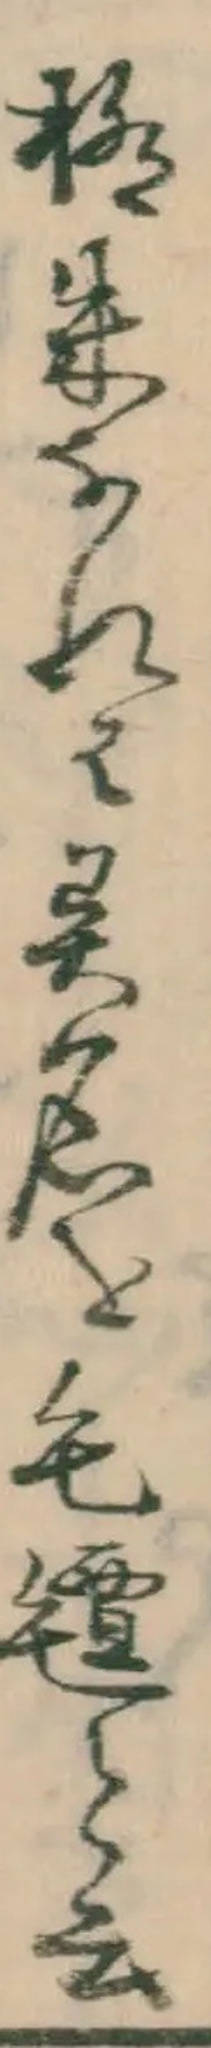極朱なれは異名を毛氈と云
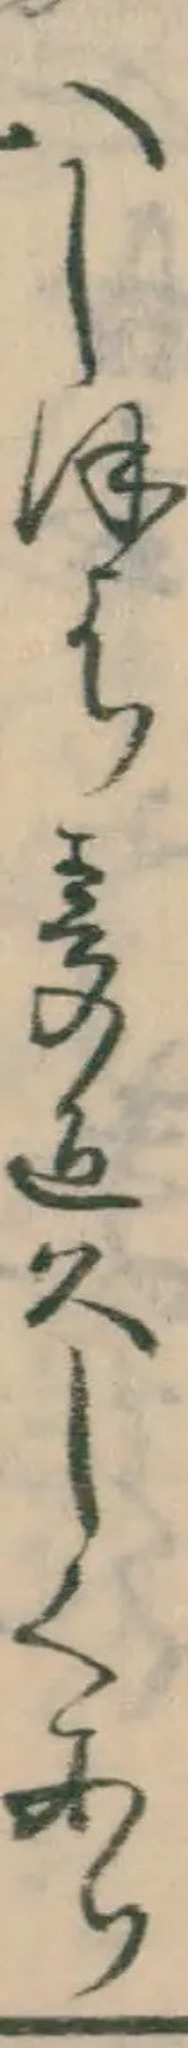八しほより春の色久しくあり
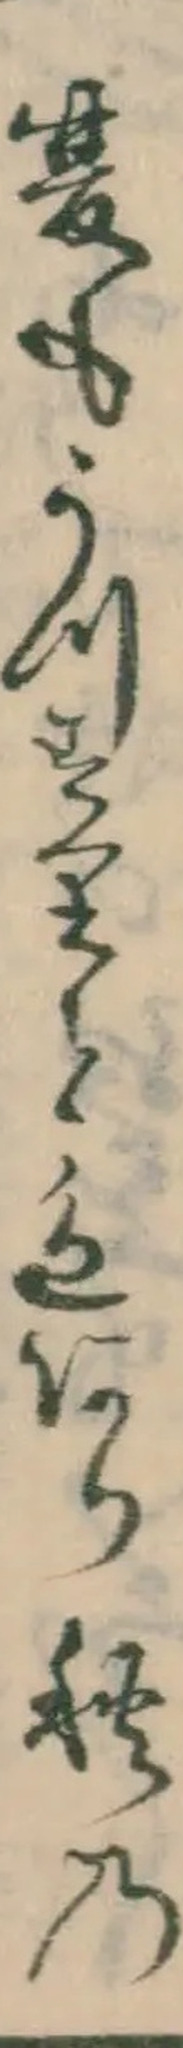夏もうつすりと色あり秋の
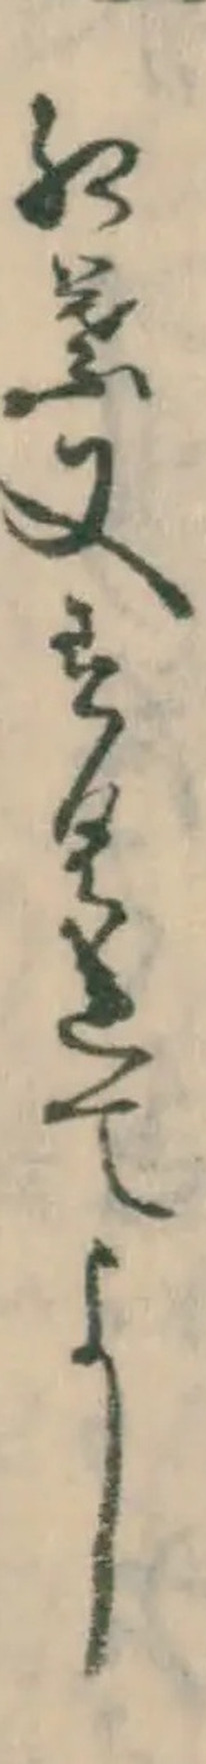紅葉又すくれてよし
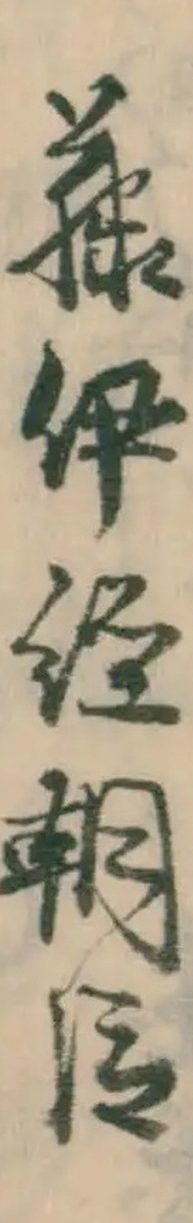藤伊経朝臣
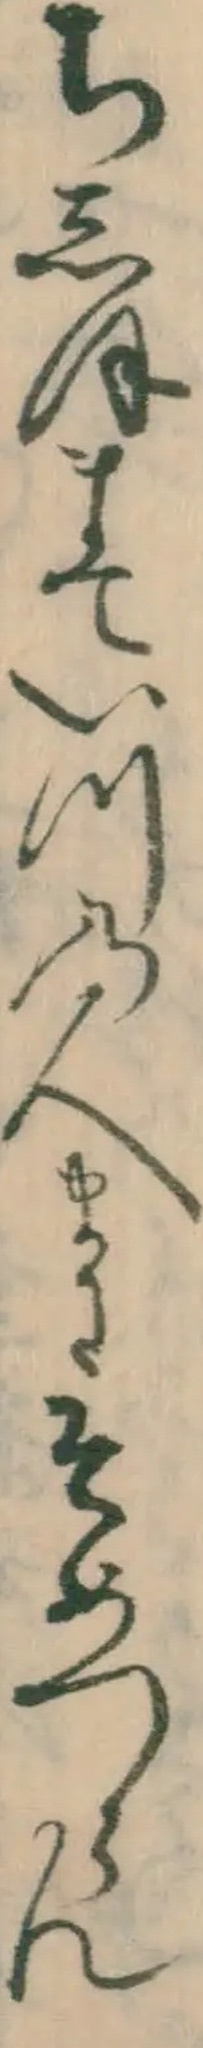ちしほまていつの人まにそめつらん
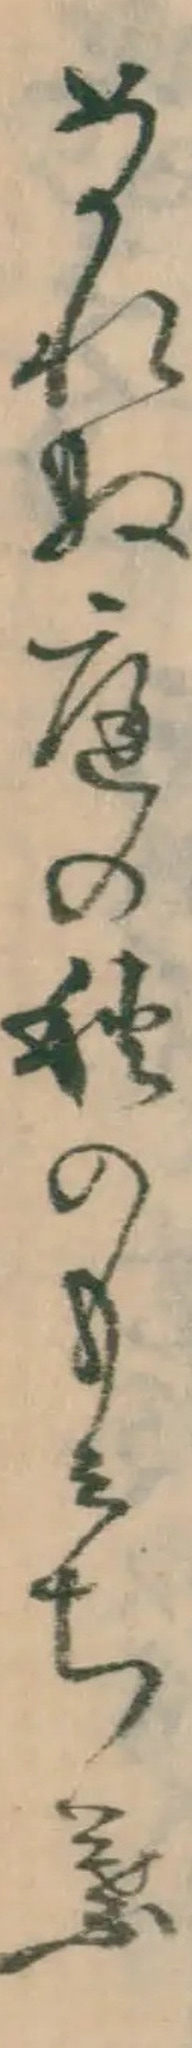めかれぬ庭の秋のもみち葉

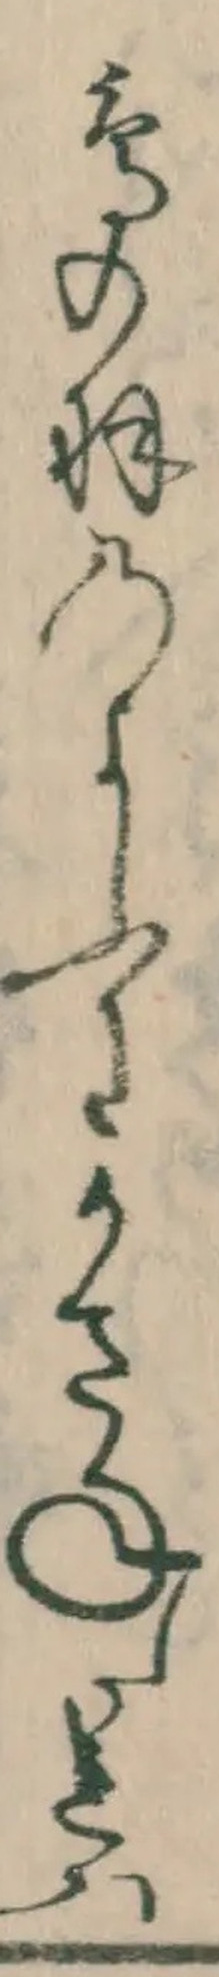鳥の羽のよふにかさねたれは
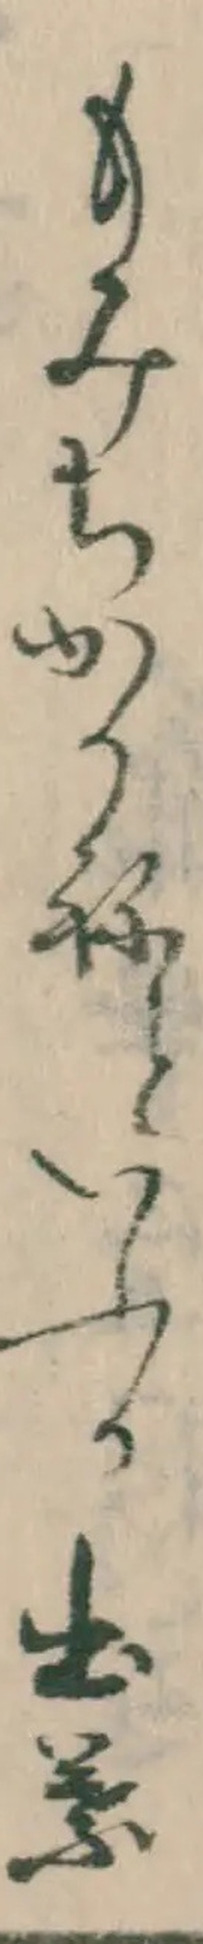もみちかさねといふか出葉
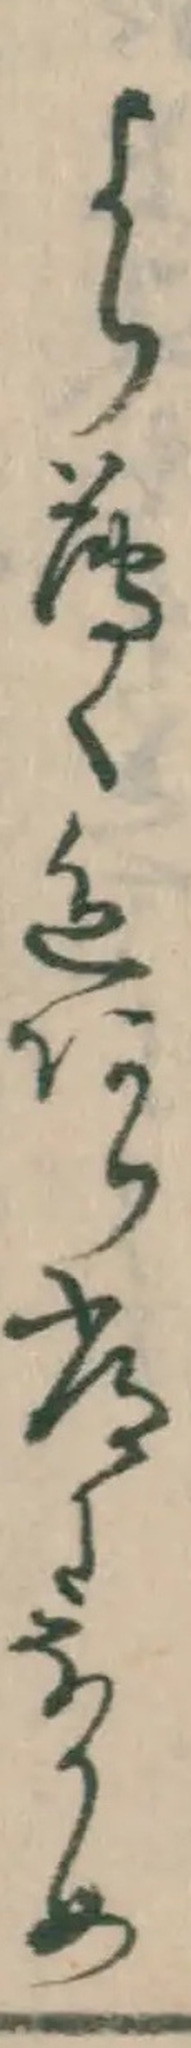より薄く色あり常になかめ
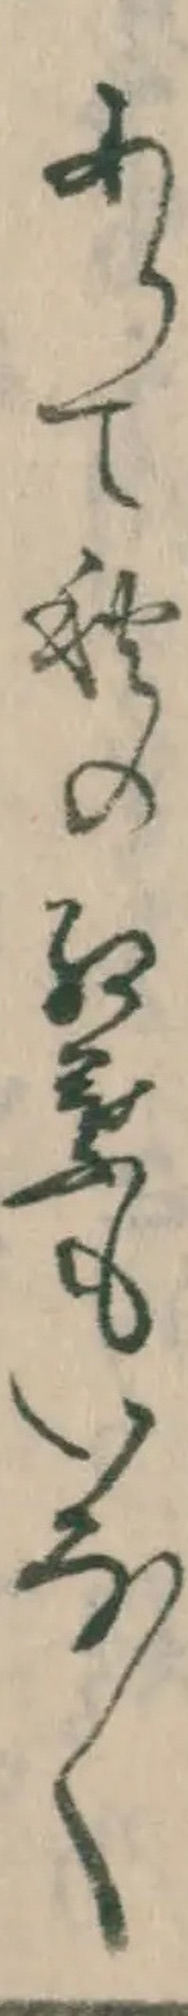ありて秋の紅葉もいろ〳〵
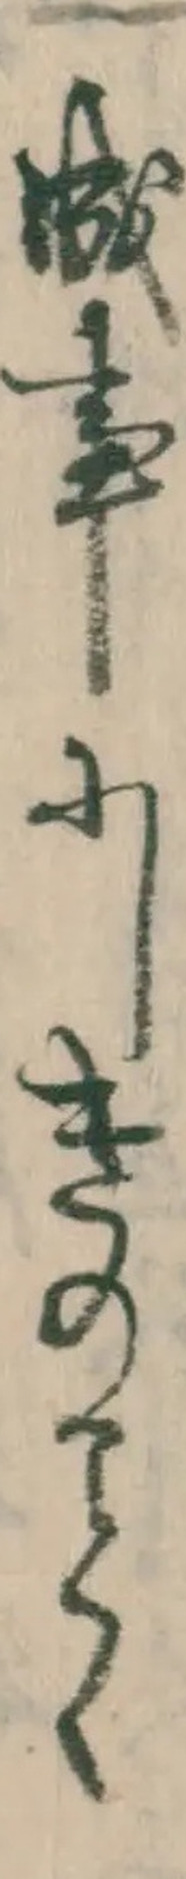成事にしきのことく
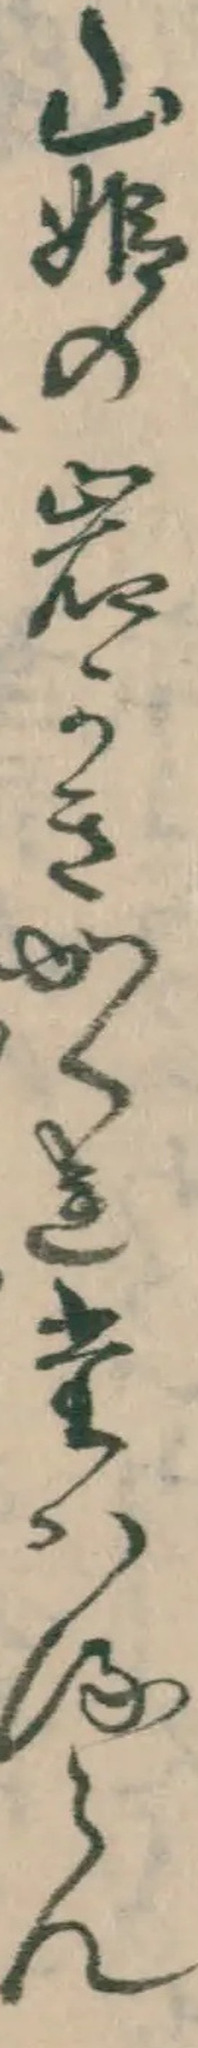山姫の岩かきかくれたはるらん
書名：紅葉集
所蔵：国立国会図書館 National Diet Library, JAPAN
